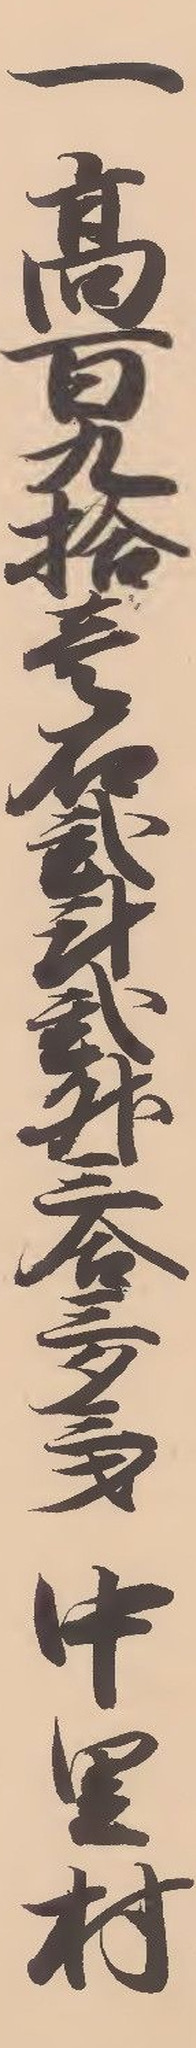一高百九拾壱石弐斗弐升三合三勺三才中里村
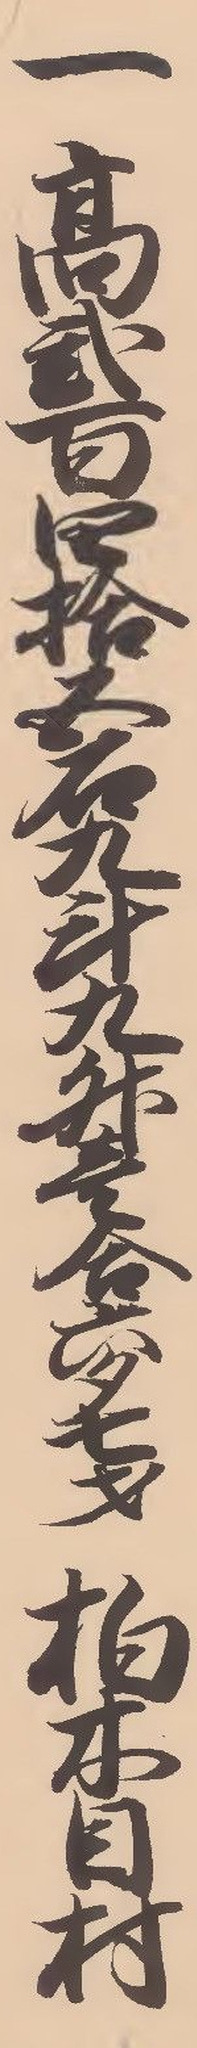一高弐百四拾五石九斗九升壱合六勺七才柏木目村

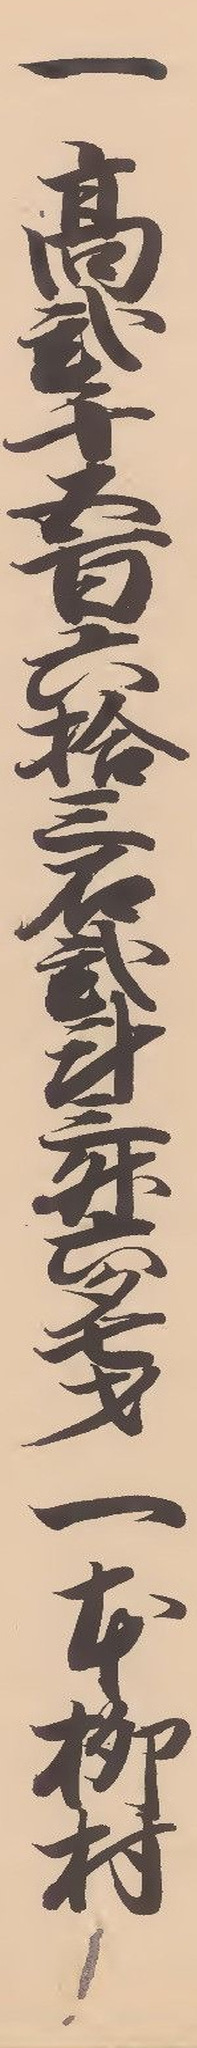一高弐千五百六拾三石弐斗三升六勺七才一本柳村
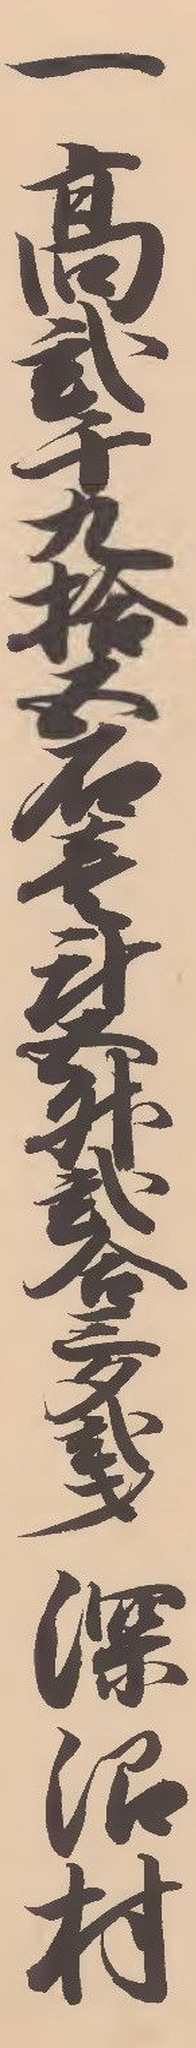一高弐千九拾五石壱斗五升弐合三勺弐才深沼村
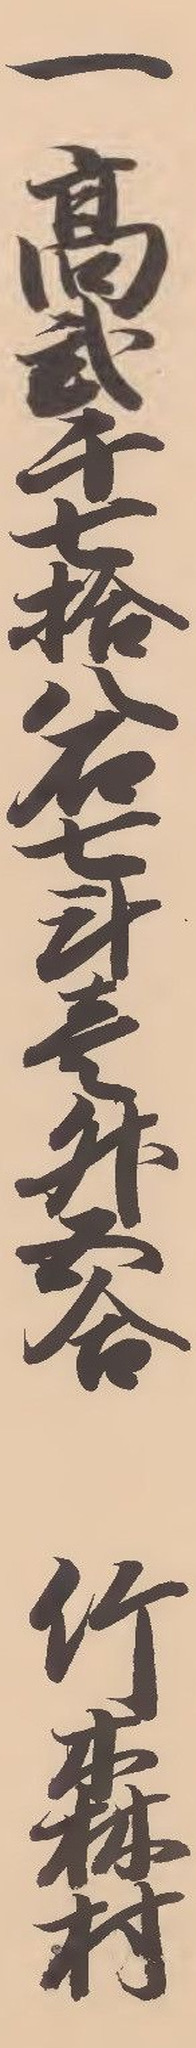一高弐千七拾八石七斗壱升五合竹森村
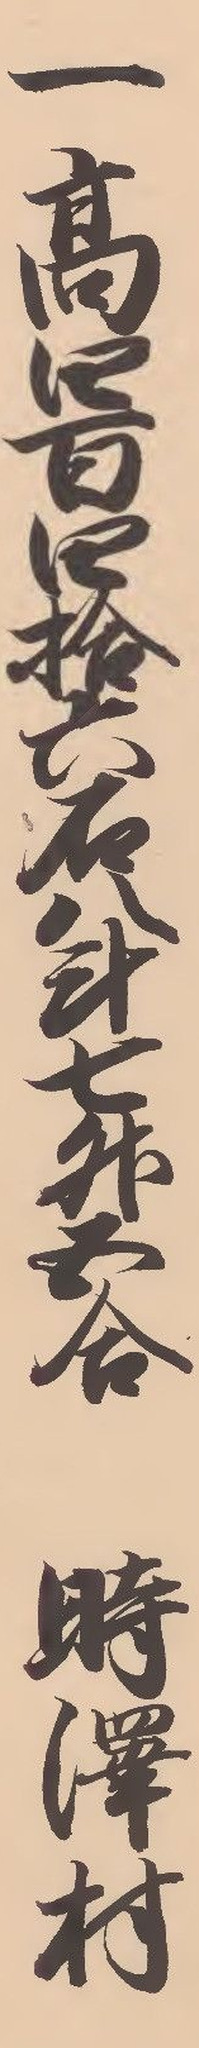一高四百四拾六石八斗七升五合時沢村
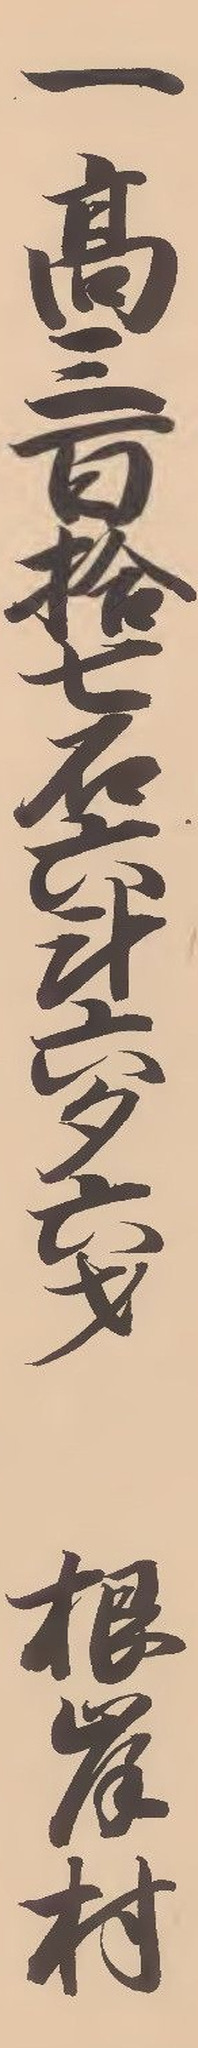一高三百拾七石六斗六勺六才根岸村
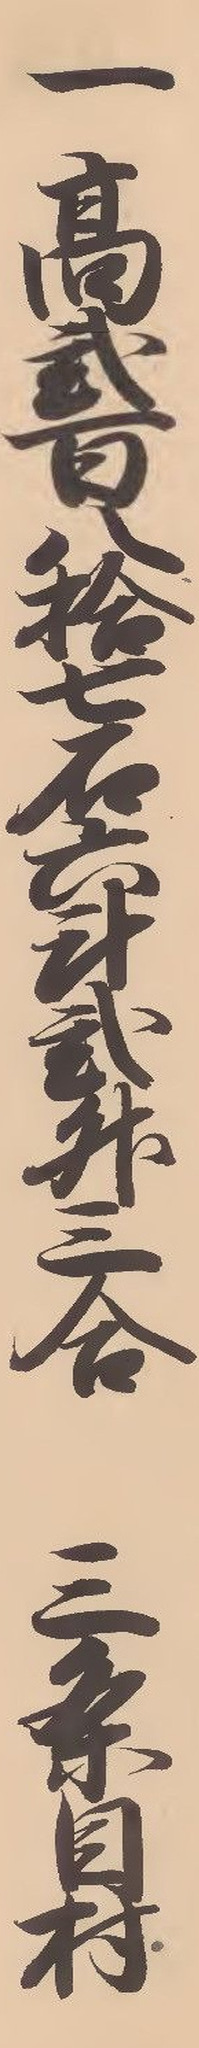一高弐百八拾七石六斗弐升三合三条目村
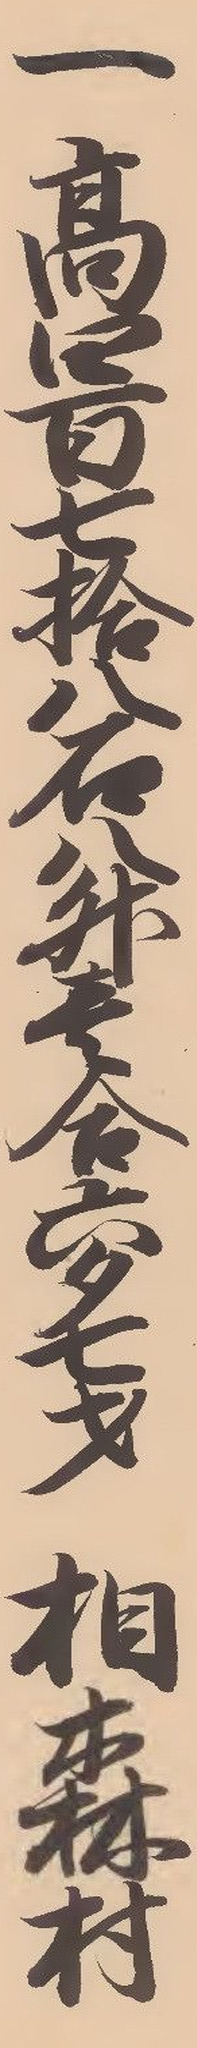一高四百七拾八石八升壱合六勺七才相森村
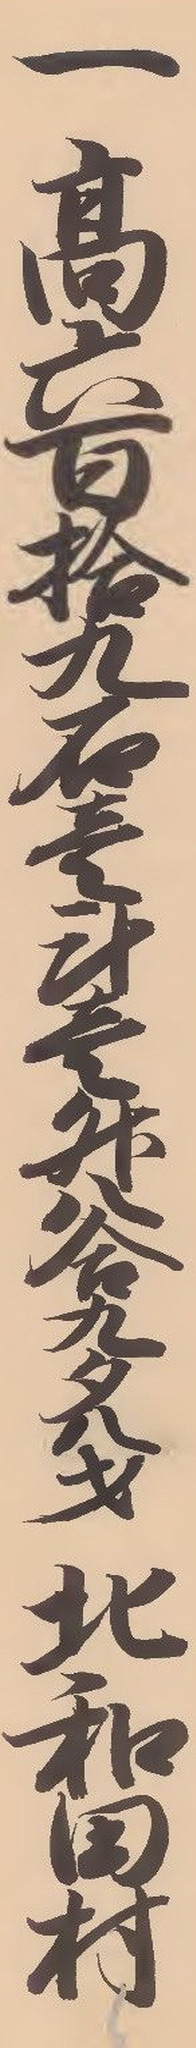一高六百拾九石壱斗壱升八合九勺八才北和田村

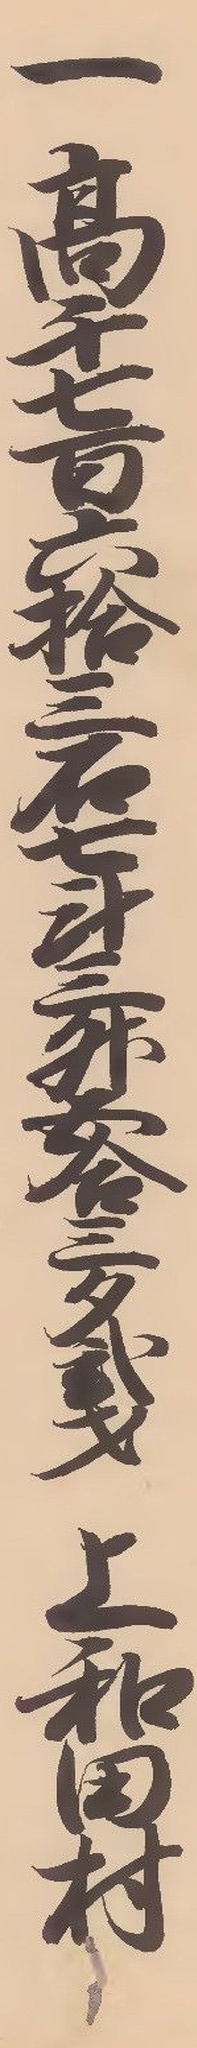一高千七百六拾三石七斗三升五合三勺弐才上和田村
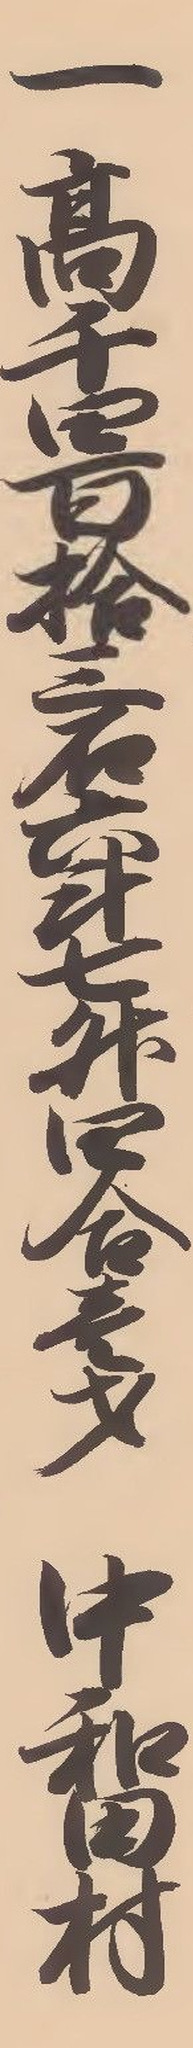一高千四百拾三石六斗七升四合壱才中和田村
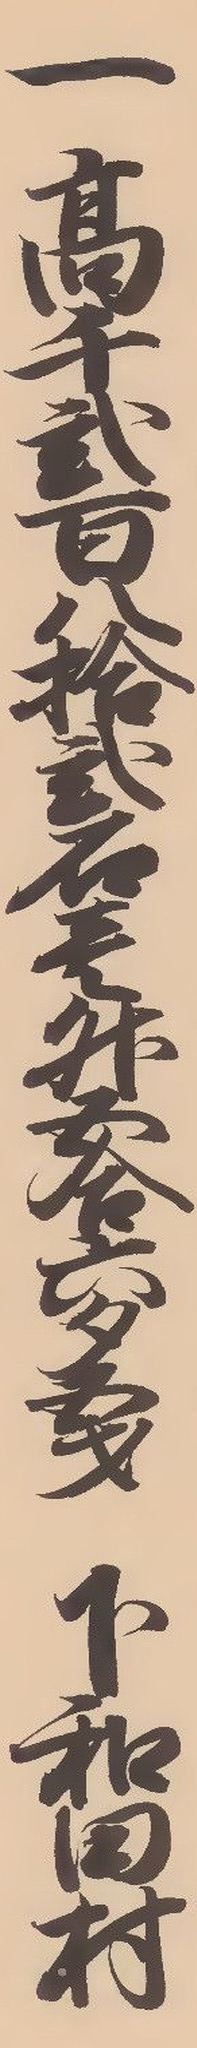一高千弐百八拾弐石壱升五合六勺五才下和田村
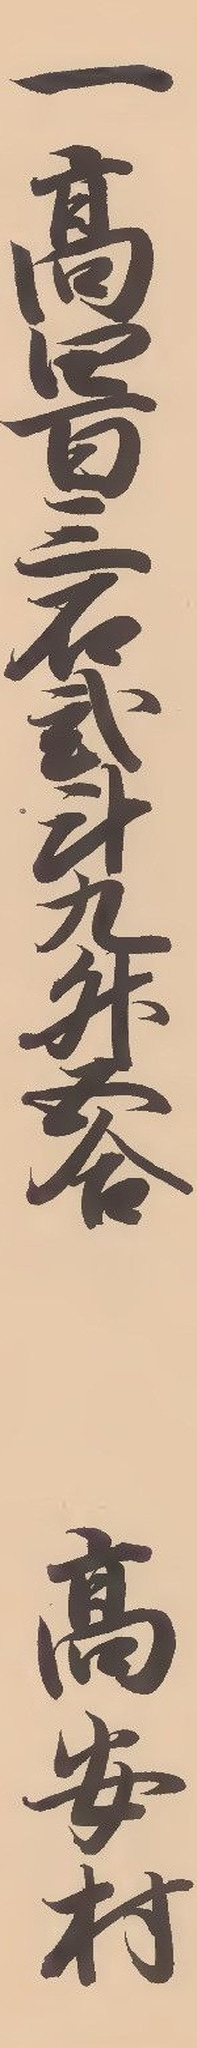一高四百三石弐斗九升五合高安村
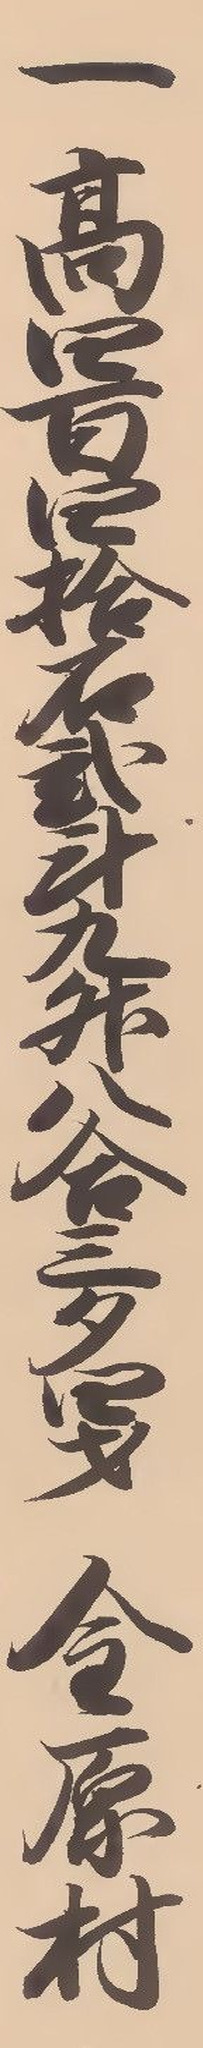一高四百四拾石弐斗九升八合三勺四才金原村
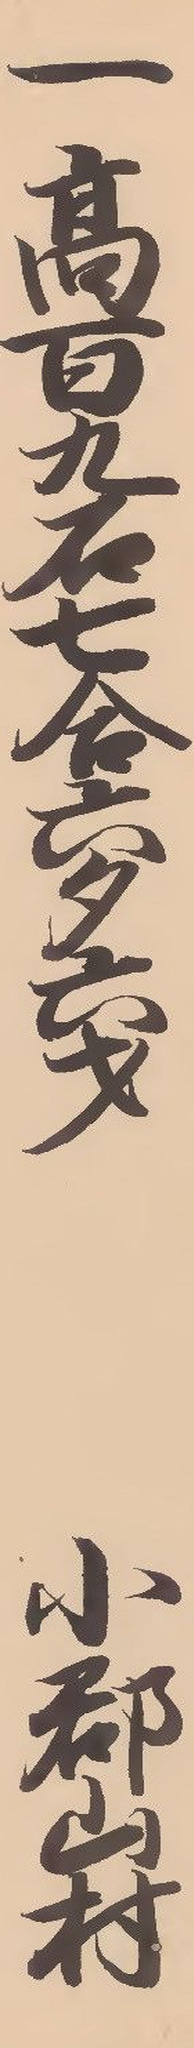一高百九石七合六勺六才小郡山村
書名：出羽国郷帳　１
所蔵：国立公文書館 National Archives of Japan
